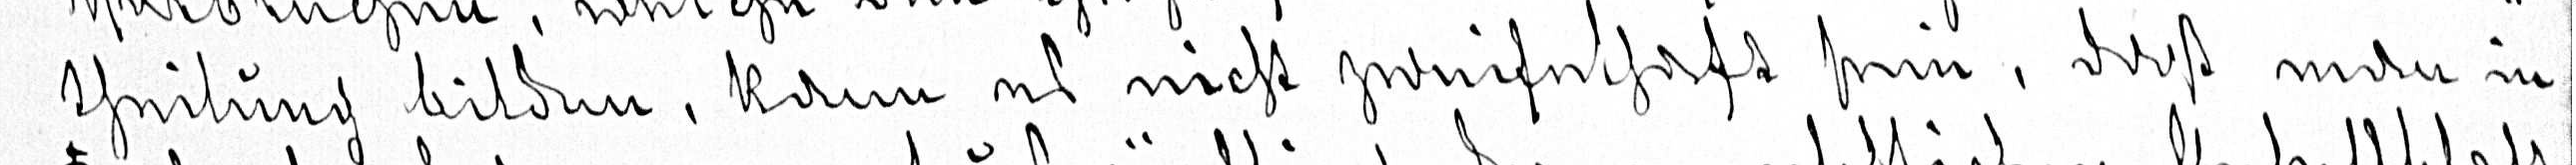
theilung bilden, kann es nicht zweifelhalf sein, daß man in
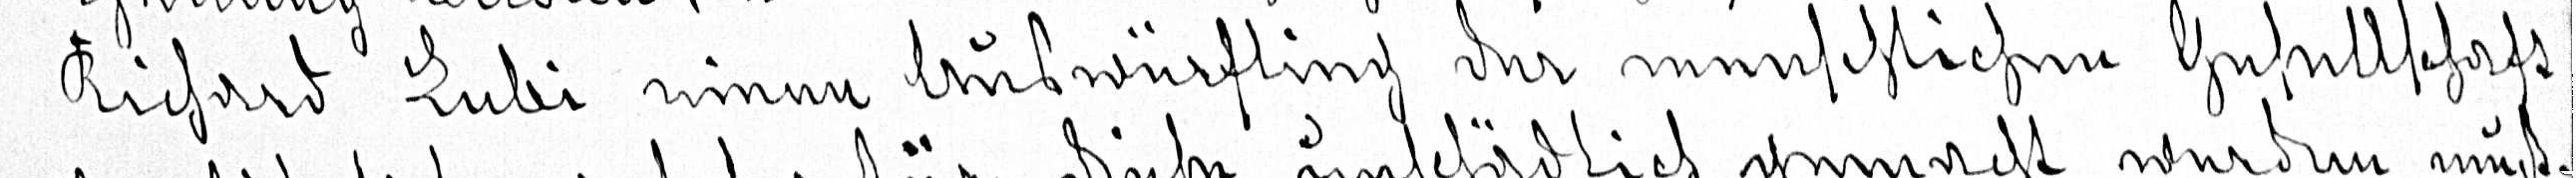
Richard Lubi einen Auswürfling der menschlichen Gesellschaft
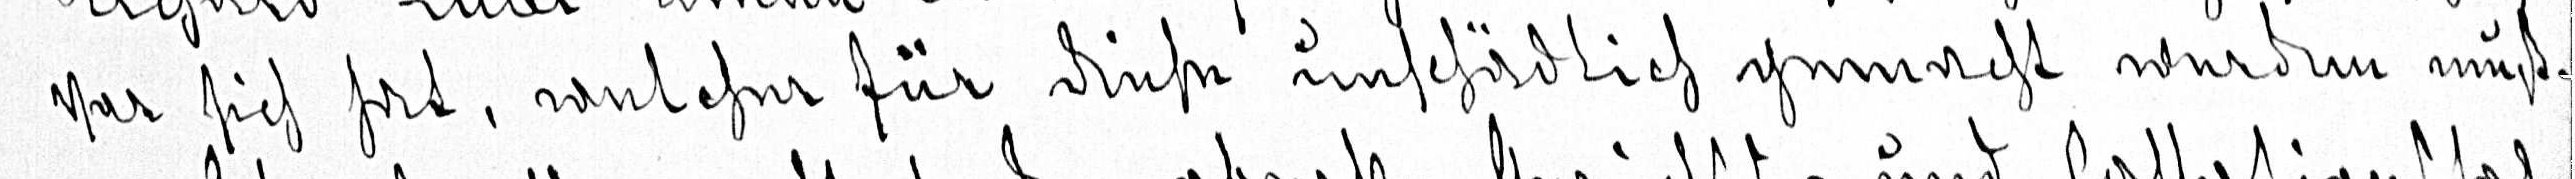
vor sich hat, welcher für diese unschädlich gemacht werden muß.
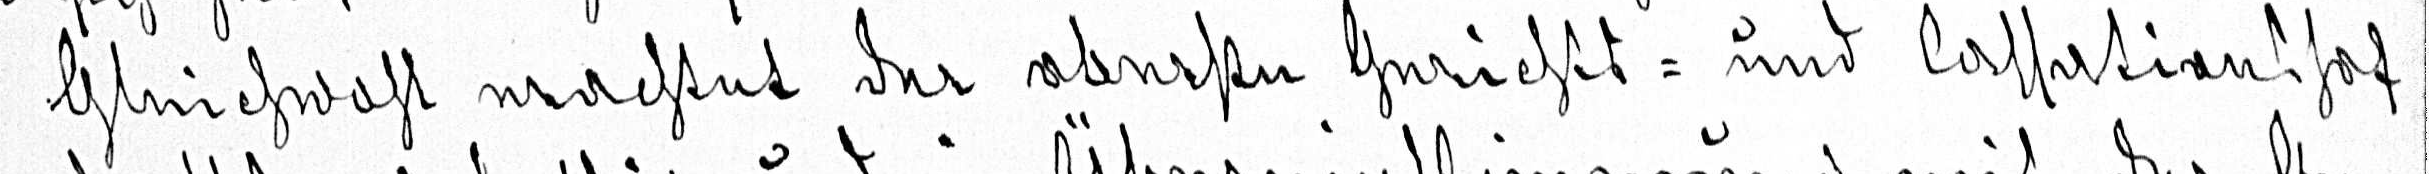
Gleichwohl erachtet der oberste Gerichts- und Cassationshof
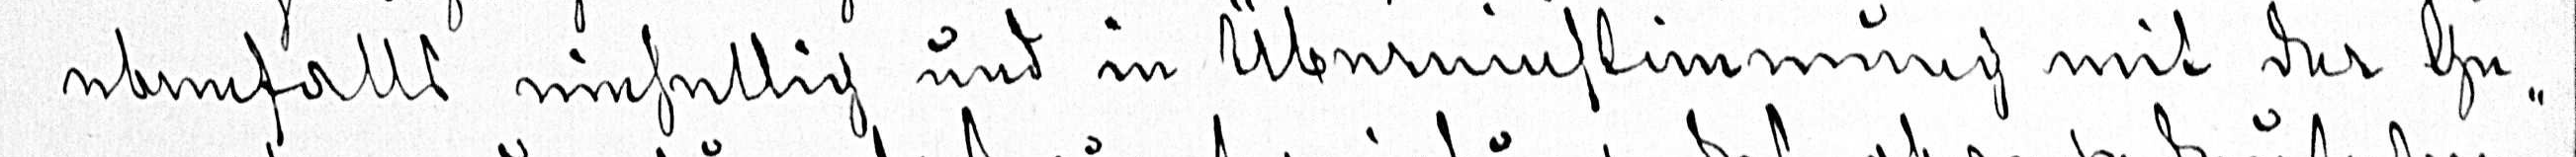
ebenfalls einhellig und in Übereinstimmung mit der Ge¬
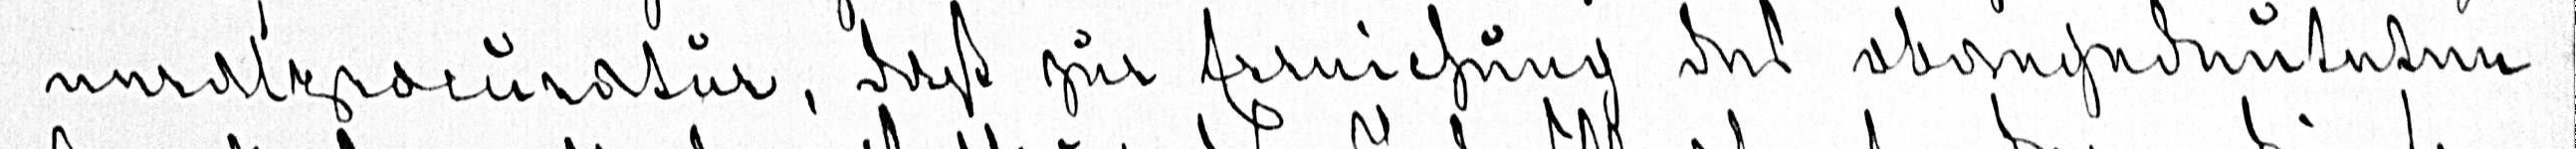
neralprocuratur, daß zur Erreichung des obangedeuteten
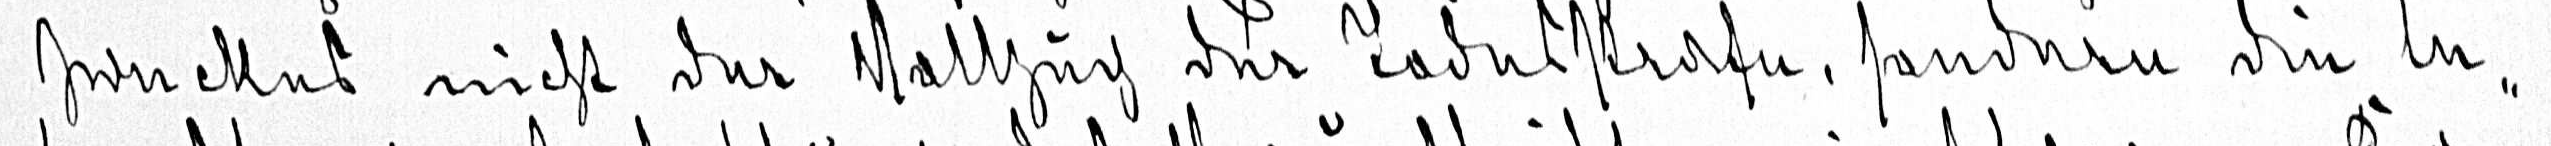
Zweckes nicht der Vollzug der Todesstrafe, sondern die le¬
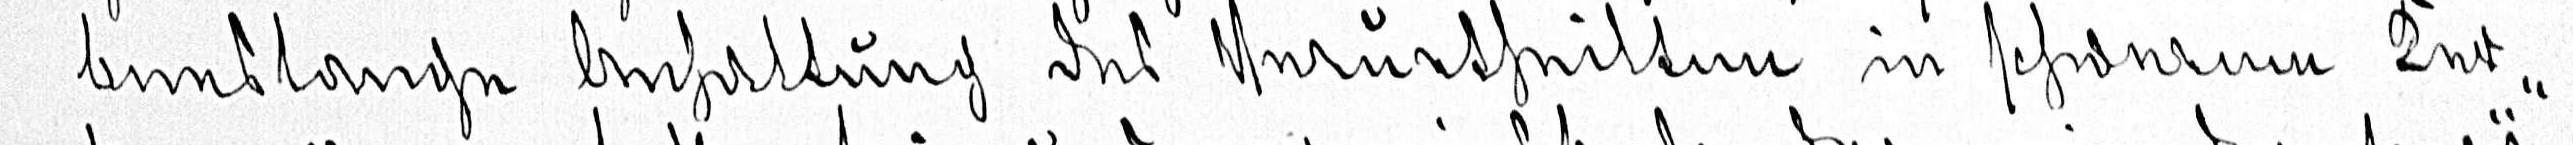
benslange Anhaltung des Verurtheilten in schweren Ker¬
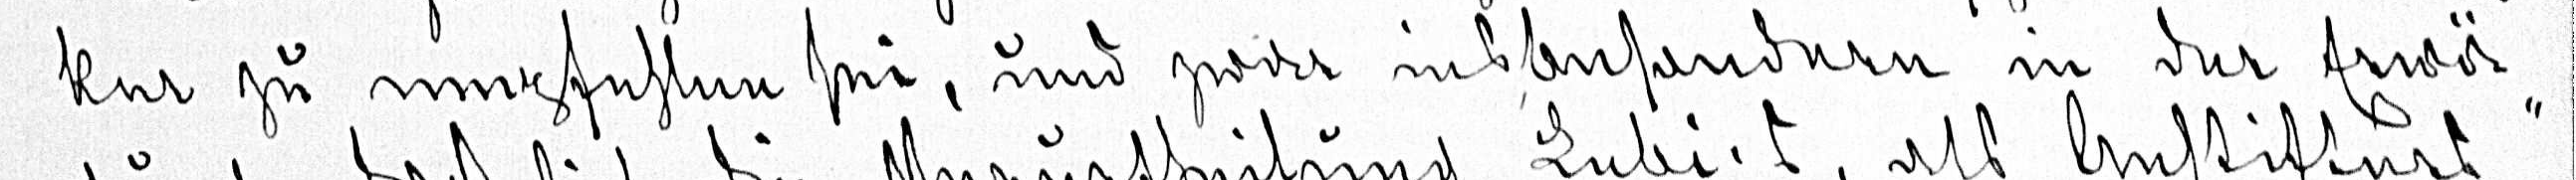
ker zu empfehlen sei, und zwar insbesondere in der Erwä¬
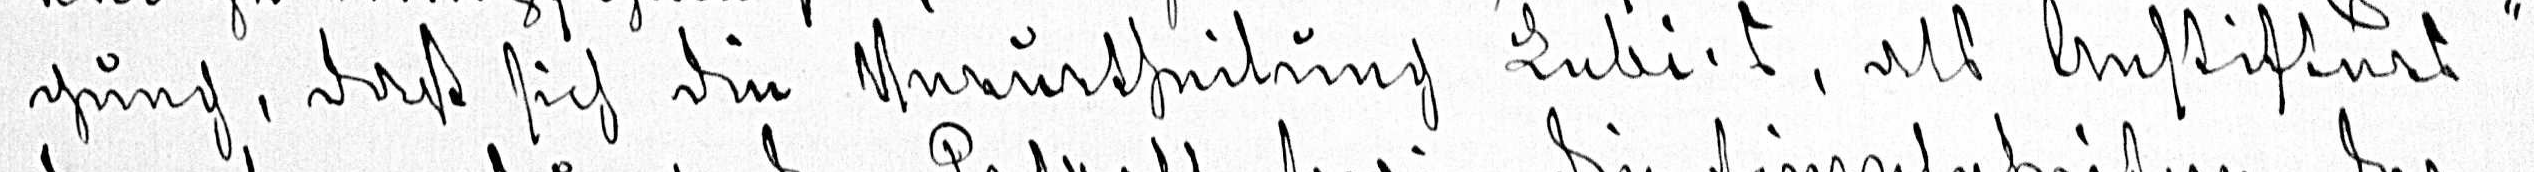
gung, daß sich die Verurtheilung Lubi’s, als Anstifters
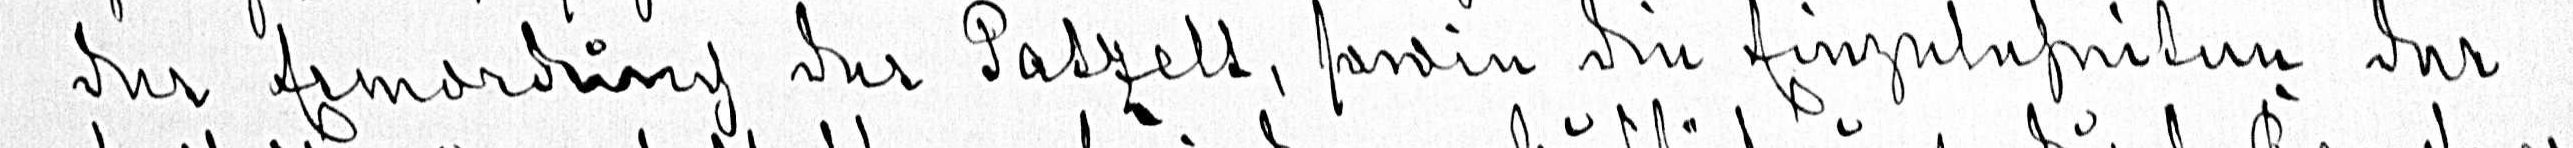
der Ermordung der Patzelt, sowie die Einzeleheiten der
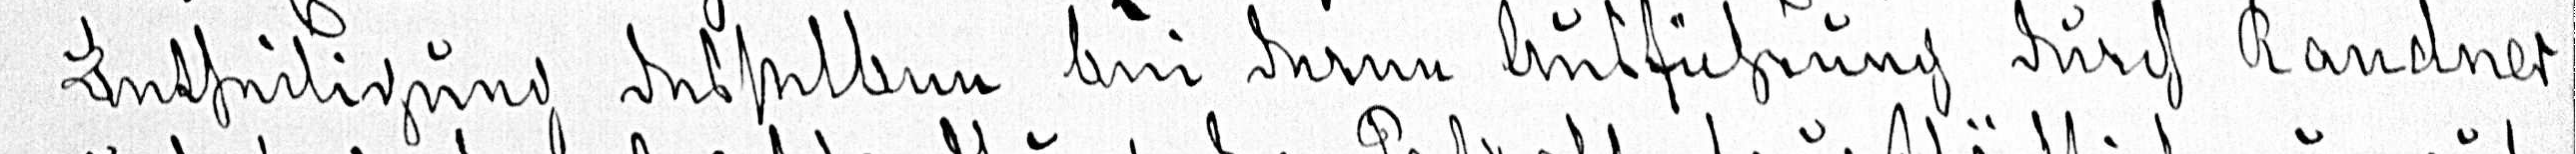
Betheiligung desselben bei deren Ausführung durch Raudner
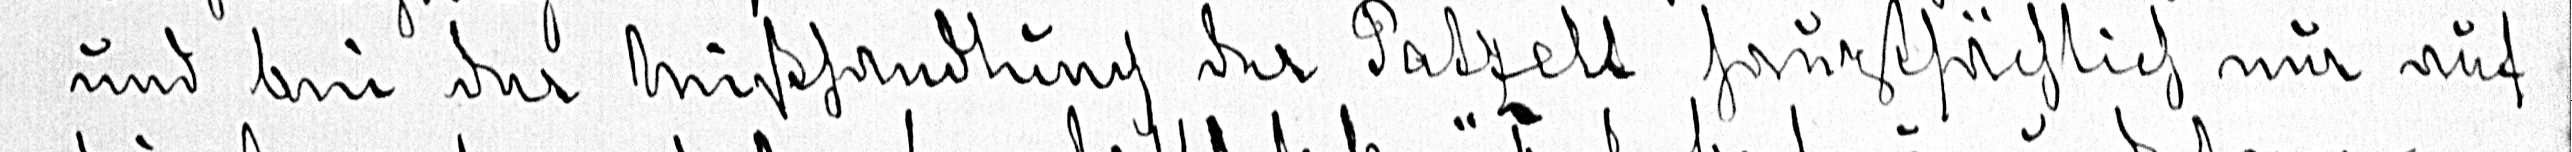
und bei der Mißhandlung der Patzelt hauptsächlich nur auf
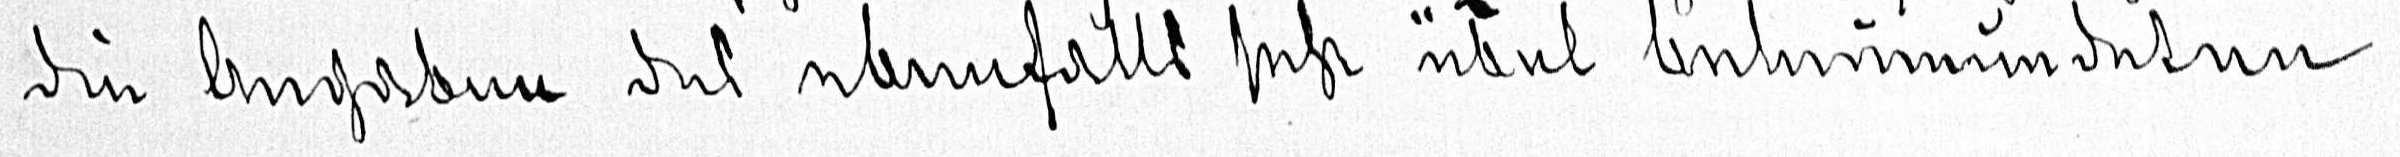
die Angaben des ebenfalls sehr übel beleumundeten
